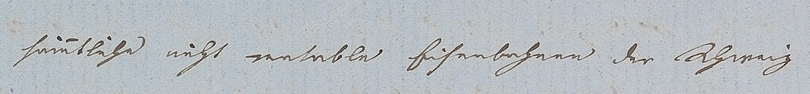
sämmtliche nicht rentable Eisenbahnen der Schweiz
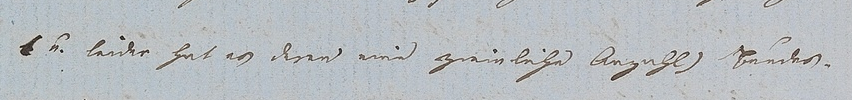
(u. leider hat es deren eine ziemliche Anzahl) Bundes-
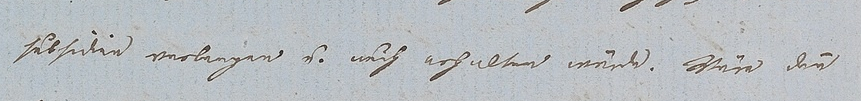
subsidien verlangen u. auch erhalten würde. Wäre dann
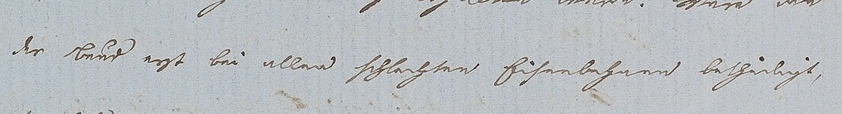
der Bund erst bei allen schlechten Eisenbahnen betheiligt,
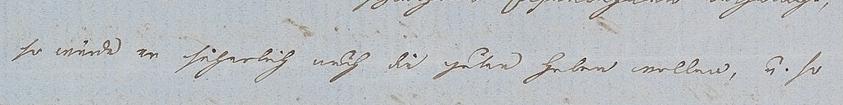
so würde er sicherlich auch die guten haben wollen, u. so
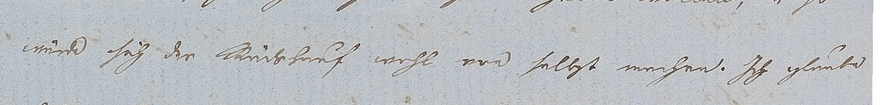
würde sich der Rückkauf wohl von selbst machen. Ich glaube
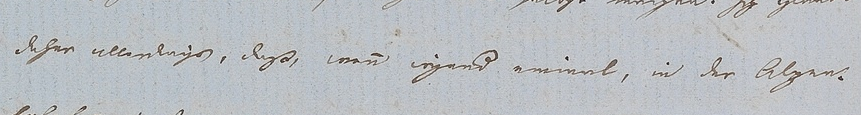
daher allerdings, daß, wenn irgend einmal, in der Alpen -
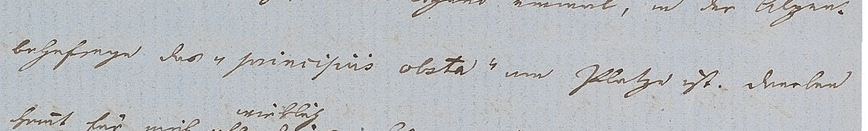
bahnfrage das «principiis obsta» am Platze ist. Daneben
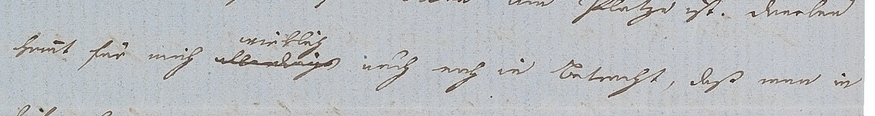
kommt für mich allerdingswirklich auch noch in Betracht, daß man in
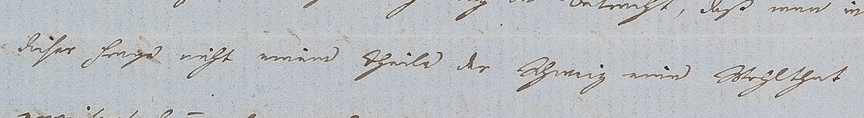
dieser Frage nicht einem Theile der Schweiz eine Wohlthat
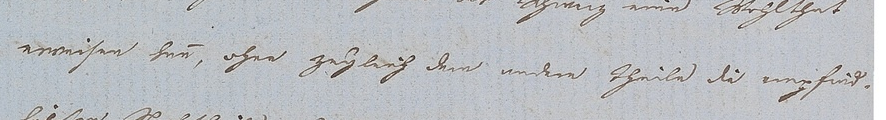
erweisen kann, ohne zugleich dem andern Theile die empfind-
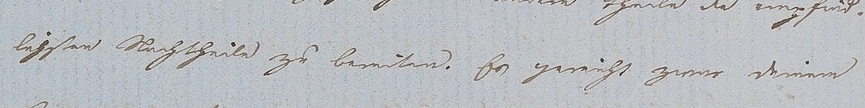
lichsten Nachtheile zu bereiten. Es gereicht zwar Deinem
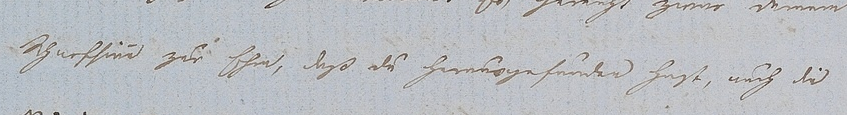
Scharfsinne zur Ehre, daß Du herausgefunden hast, auch die
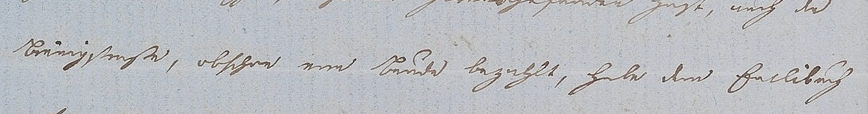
Brünigstraße, obschon vom Bunde bezahlt, habe dem Entlibuch
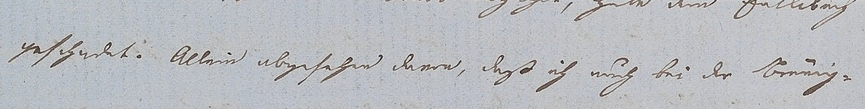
geschadet. Allein abgesehen davon, daß ich auch bei der Brünig -
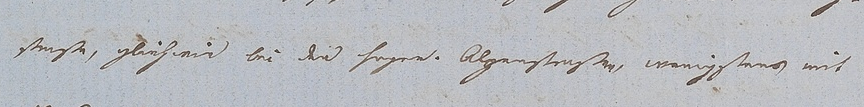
straße, gleichwie bei den sogen. Alpenstraßen, wenigstens mit
